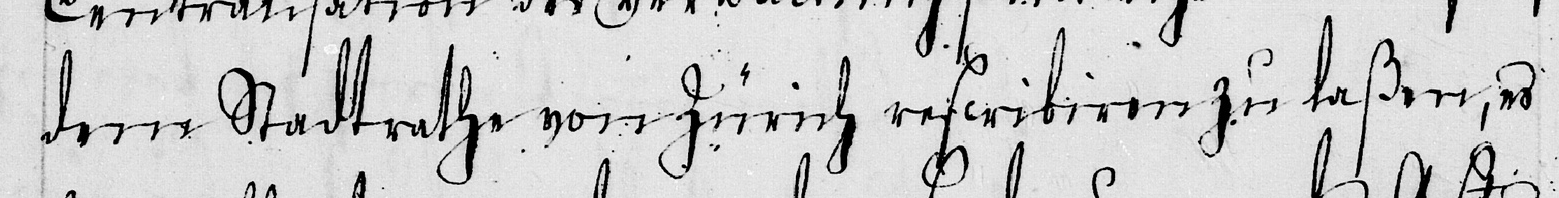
dem Stadtrath von Zürich rescribiren zu laßen, es
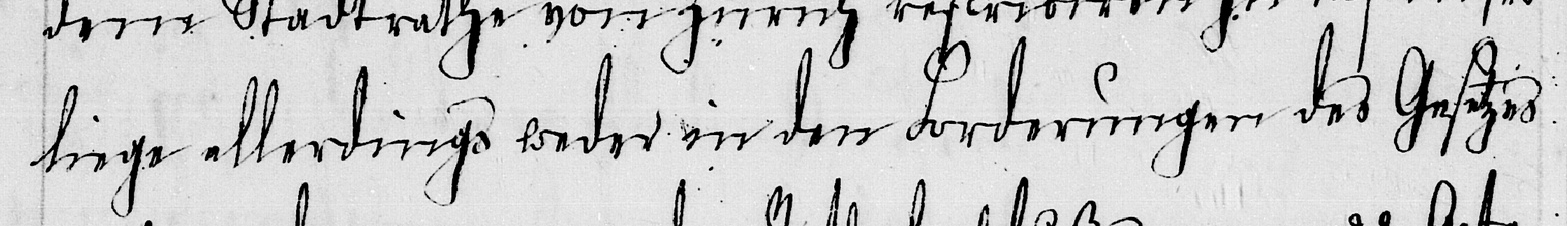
liege allerdings weder in den Forderungen des Gesetzes
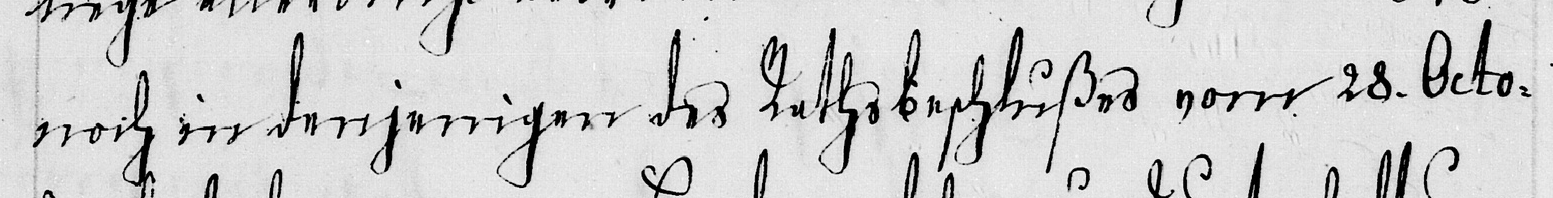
noch in denjenigen des Rathsbeschlußes vom 28. October
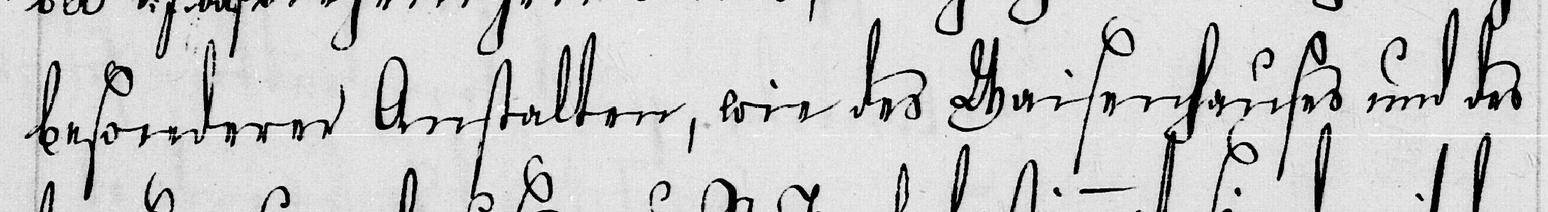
besonderer Anstalten, wie des Waisenhauses und des
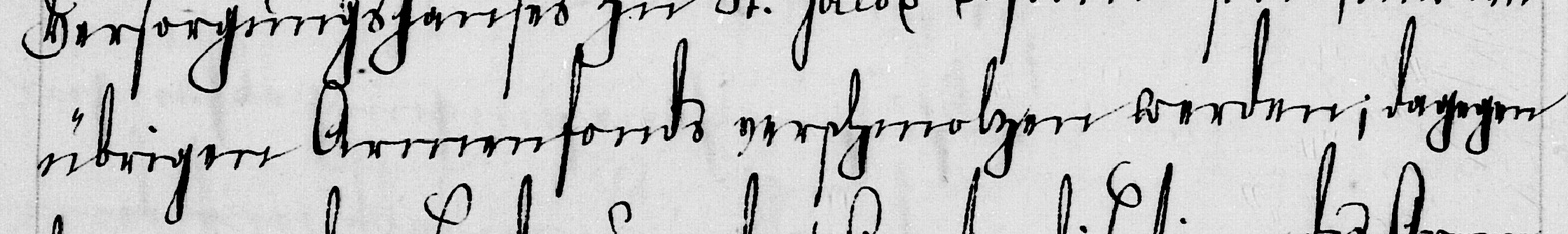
übrigen Armenfonds verschmolzen werden; dagegen
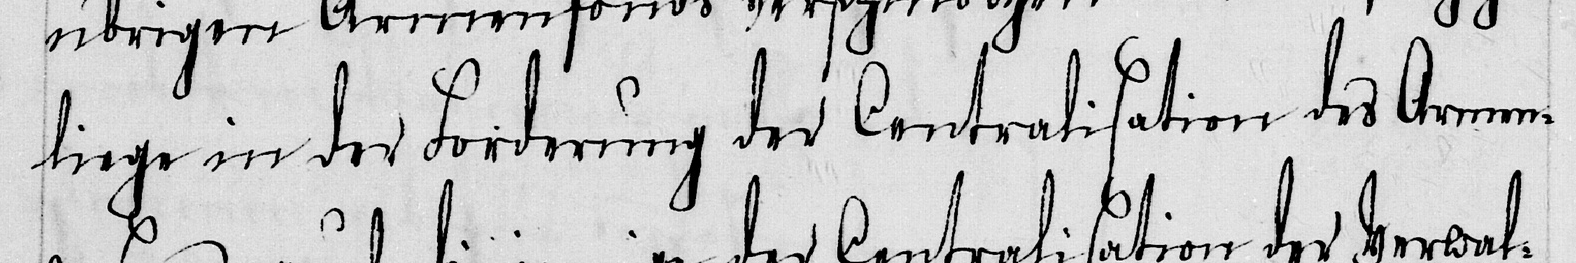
liege in der Forderung der Centralisation des Armen¬
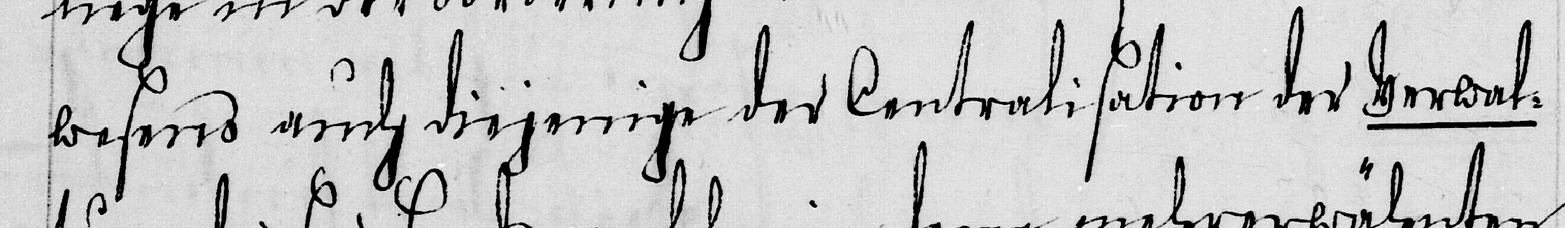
wesens auch diejenige der Centralisation der Verwal¬
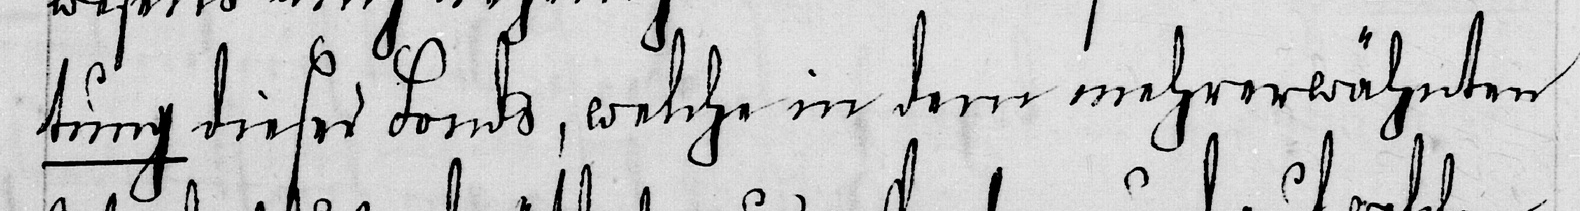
tung dieser Fonds, welche in dem mehrerwähnten
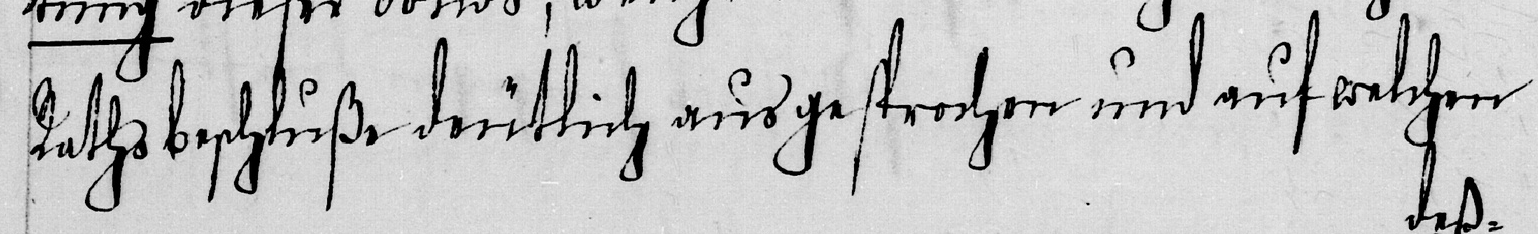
Rathsbeschluße deutlich ausgesprochen und auf welchen
